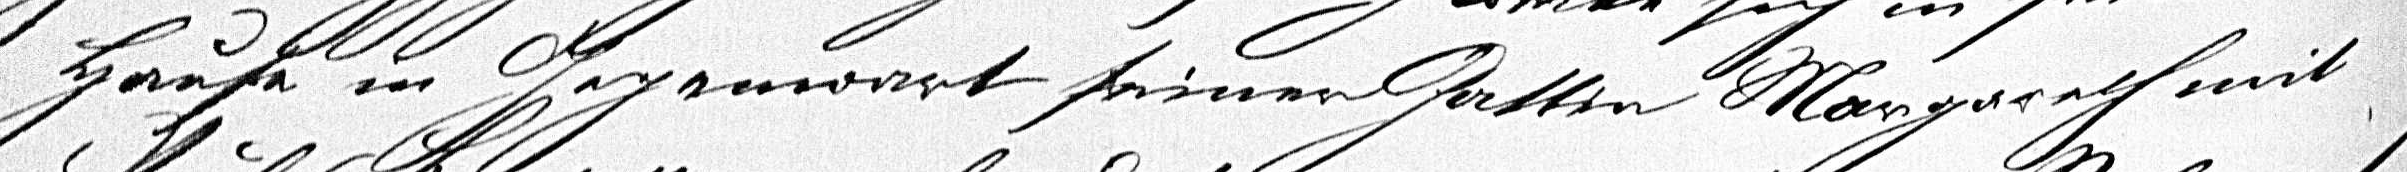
Hause in Gegenwart seiner Gattin Margareth mit
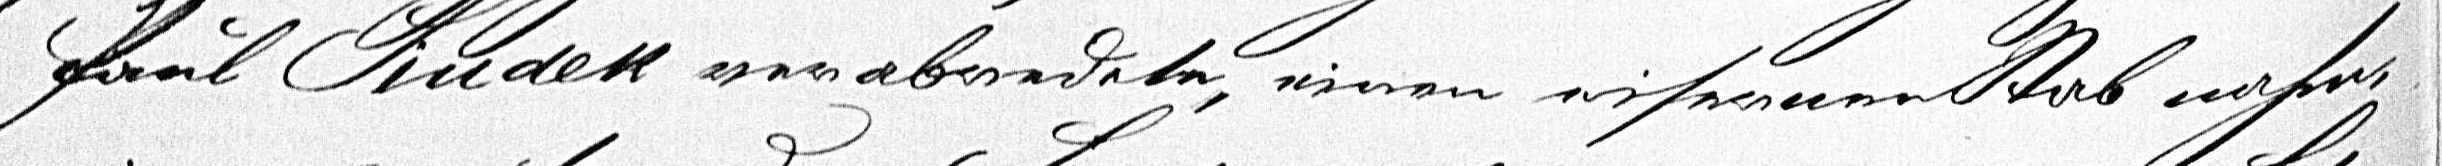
Paul Sindek verabredete, einen eisernen Stab nahm,
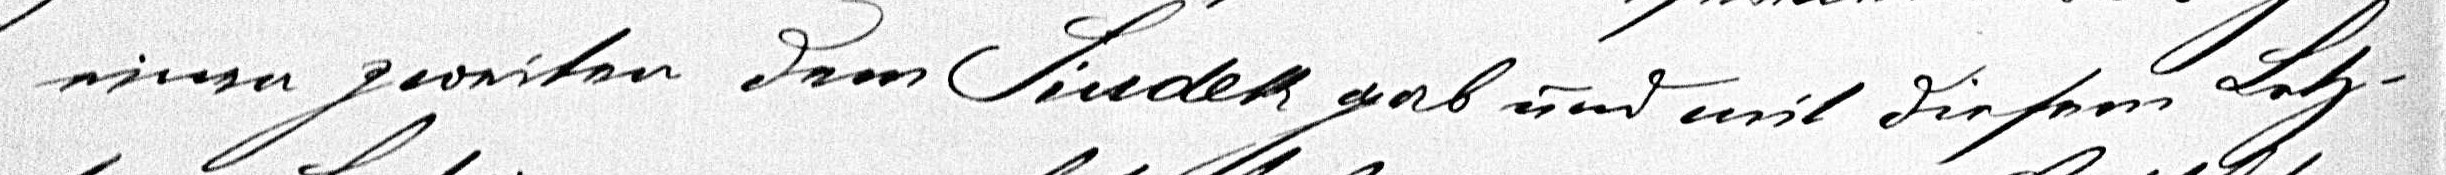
einen zweiten dem Sindek gab und mit diesem Letz¬
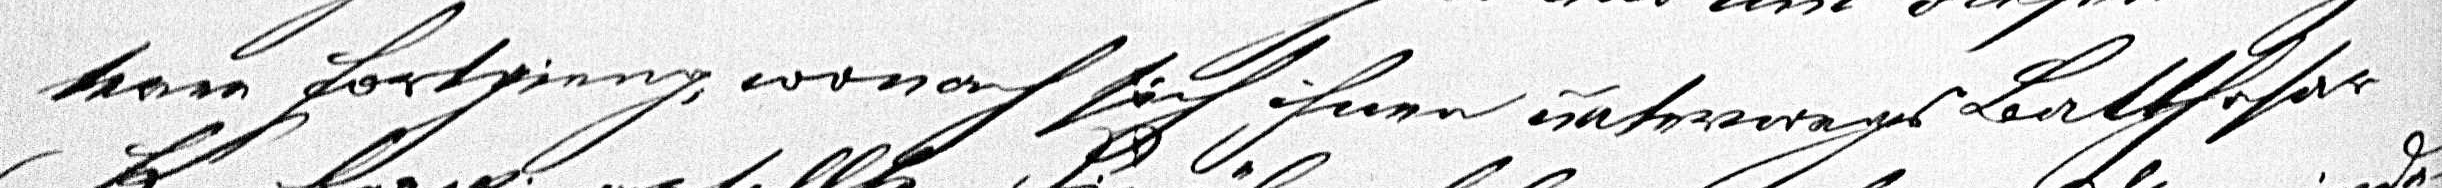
teren fortging, wonach sich ihnen unterwegs Balthasar
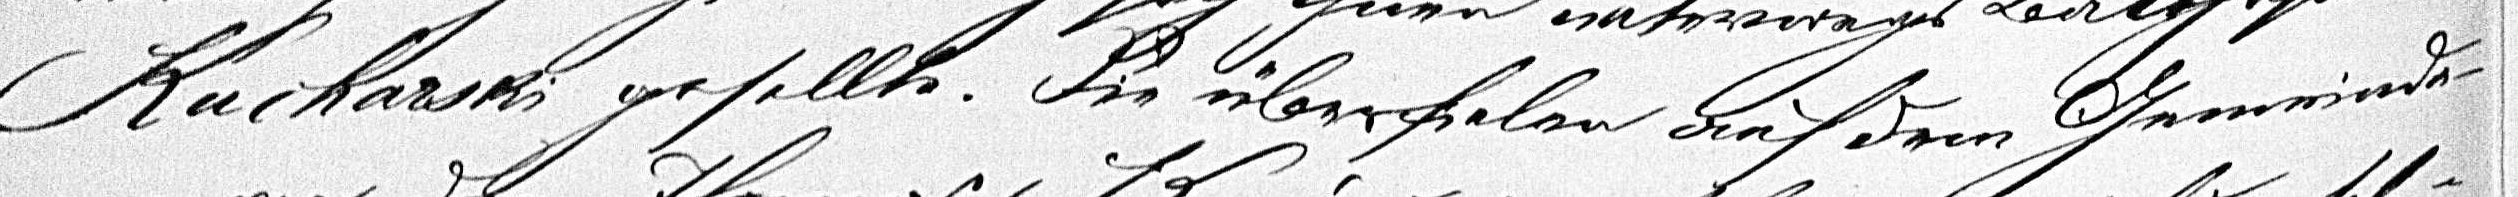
Kucharksi gesellte. Sie überfielen auf dem Gemeinde¬
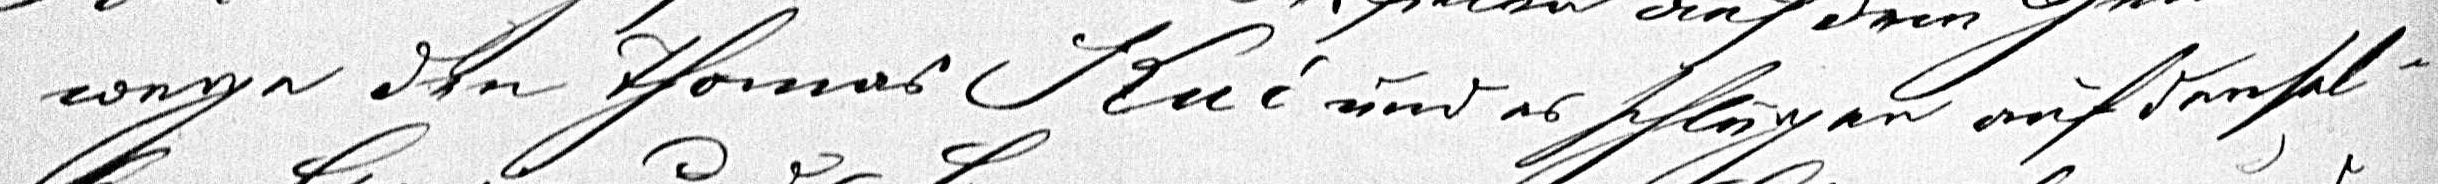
wege den Thomas Kuć und es schlugen auf densel¬
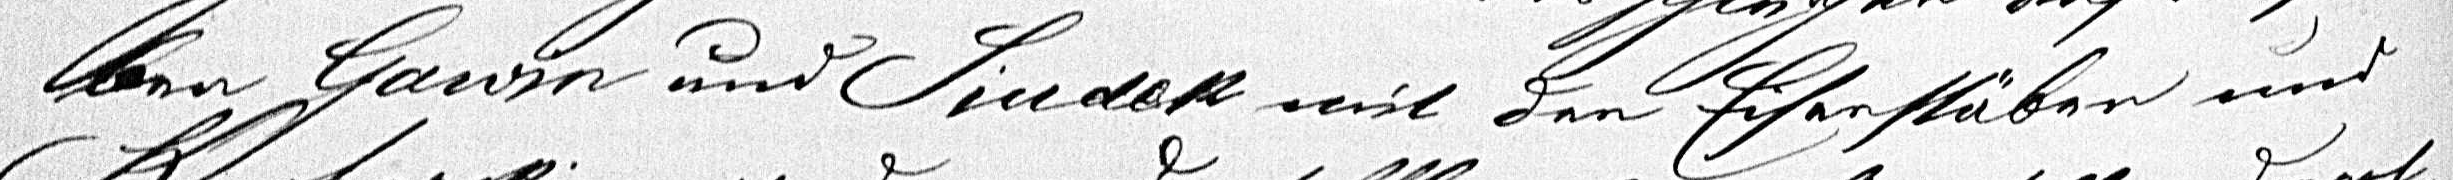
ben Gawin und Sindek mit den Eisenstäber und
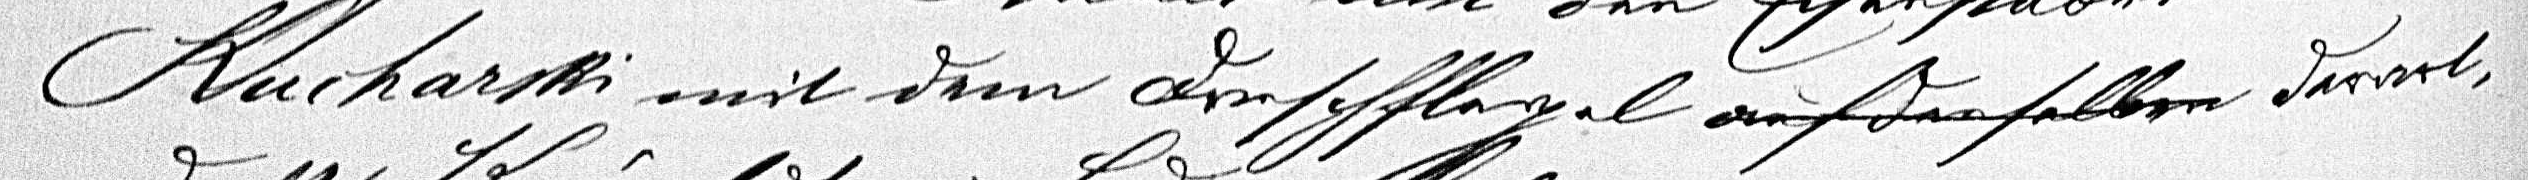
Kucharski mit dem Dreschflegel derart,
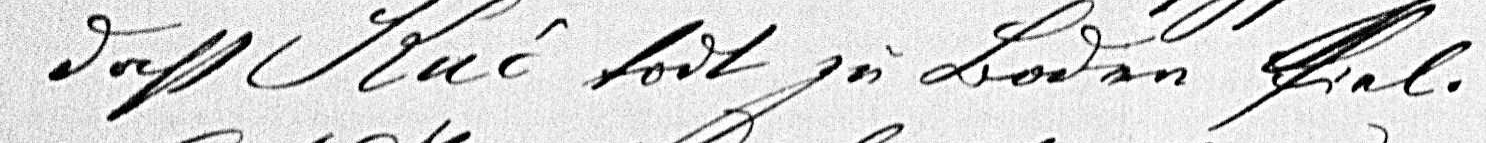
daß Kuć todt zu Boden fiel.
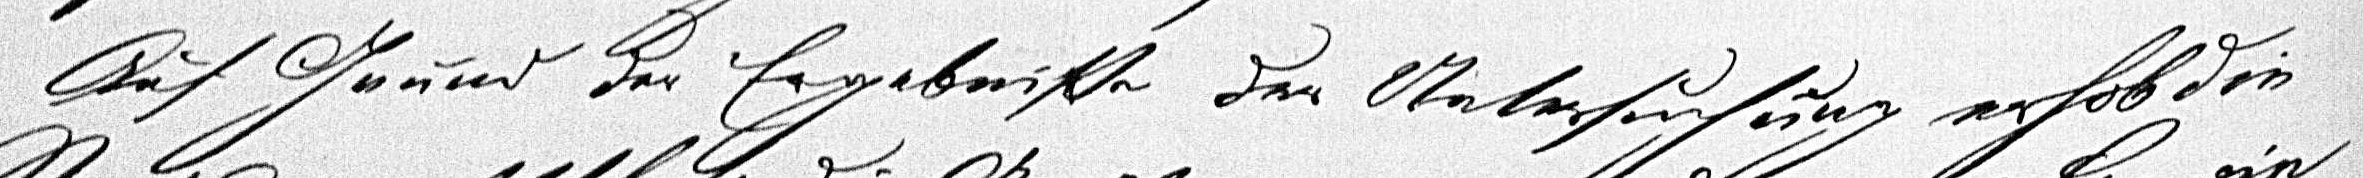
Auf Grund der Ergebniße der Untersuchung erhob die
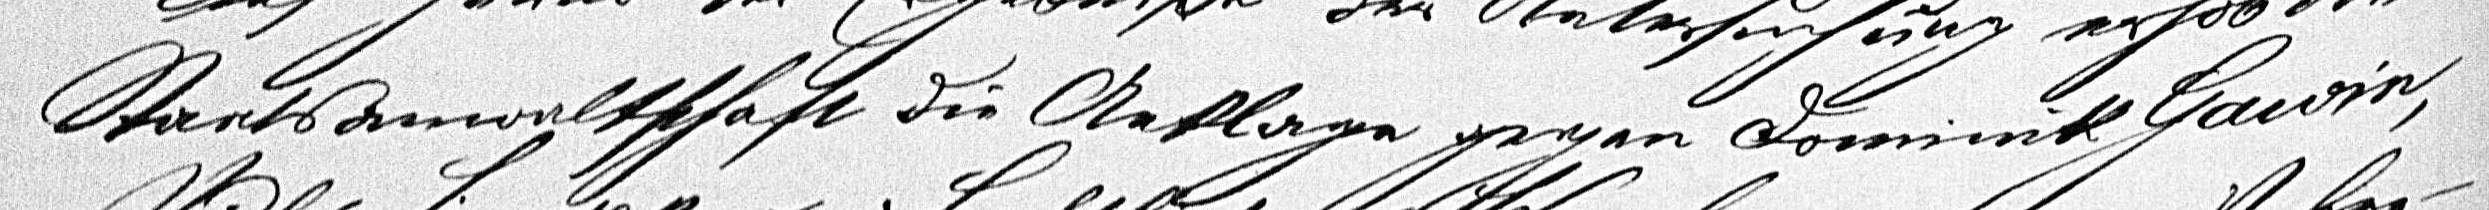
Staatsanwaltschaft die Anklage gegen Dominik Gawin,
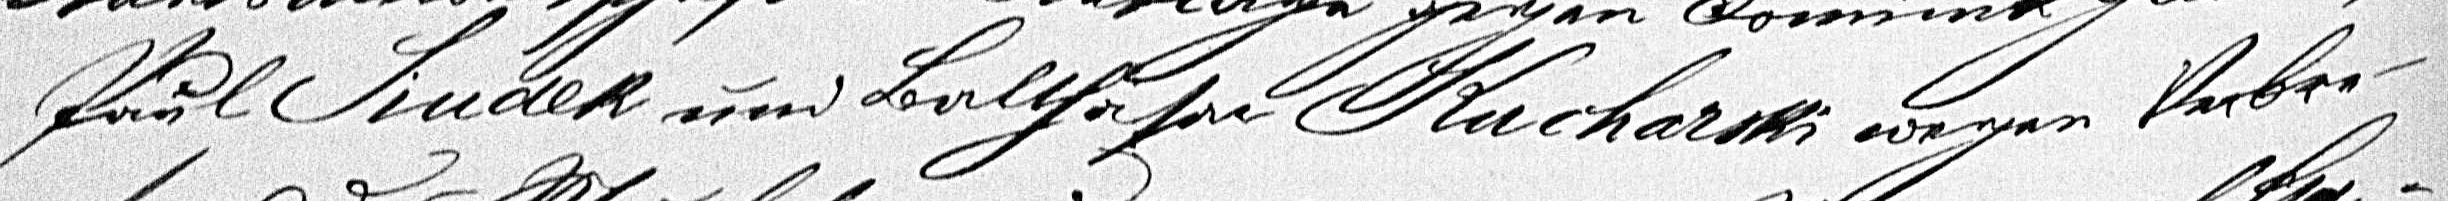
Paul Sindek und Balthasar Kucharski wegen Verbre¬
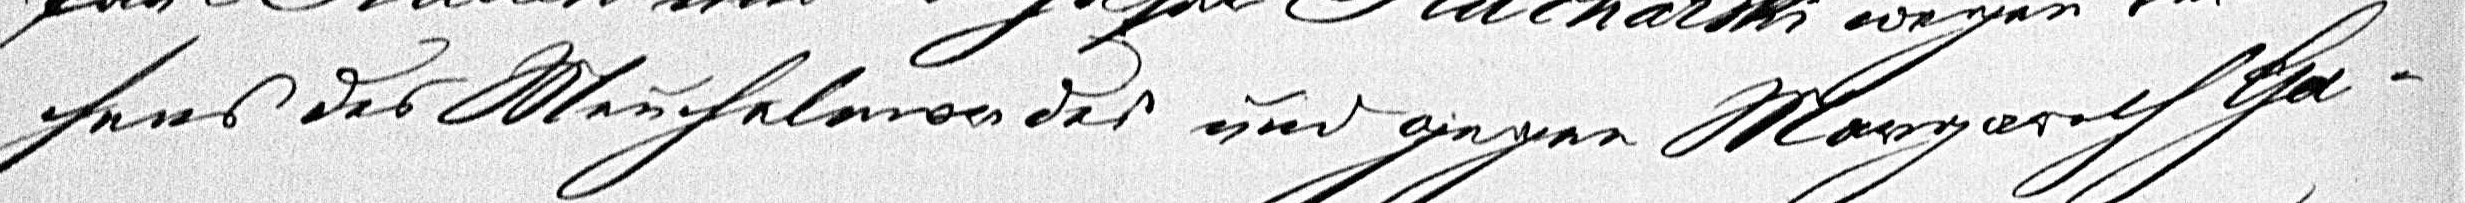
chens des Meuchelmordes und gegen Margareth Ga¬
